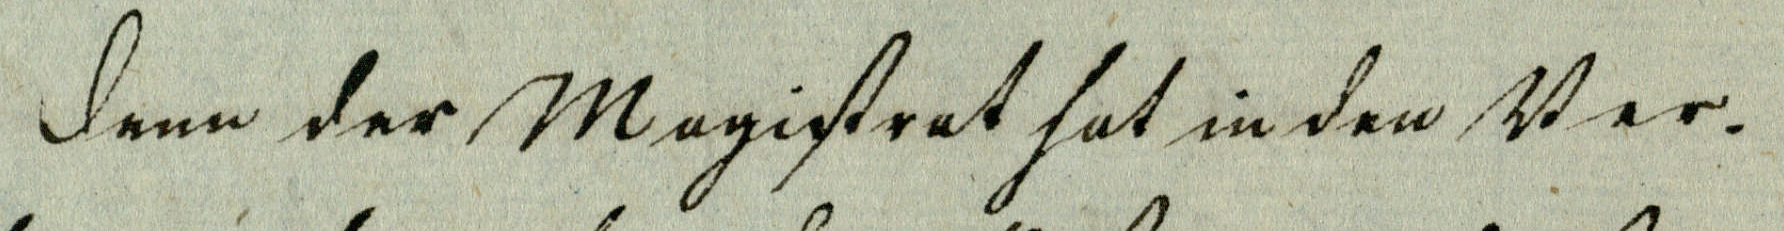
Denn der Magistrat hat in den Ver¬
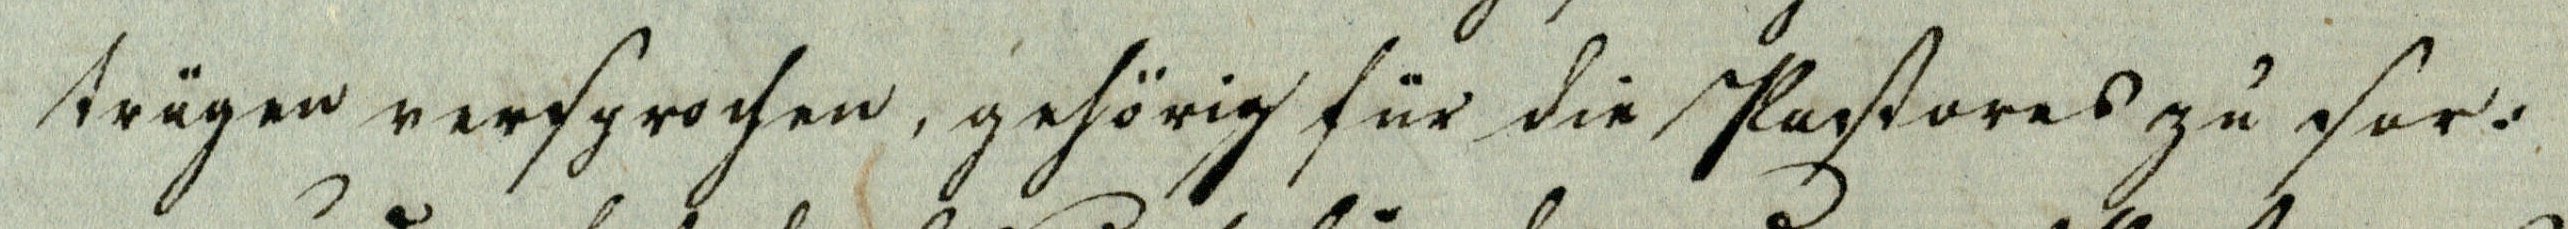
trägen versprochen, gehörig für die Pastores zu sor¬
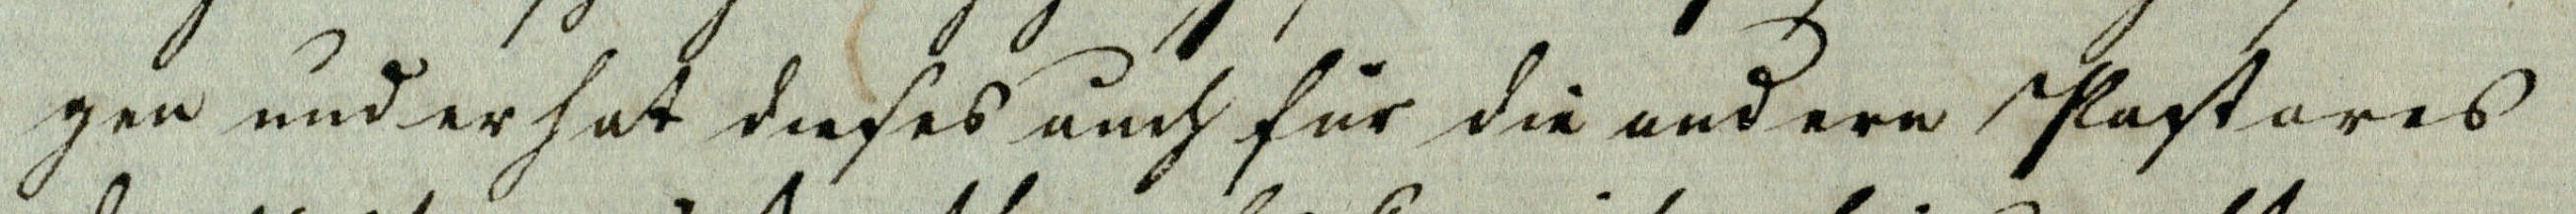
gen und er hat dieses auch für die andern Pastores
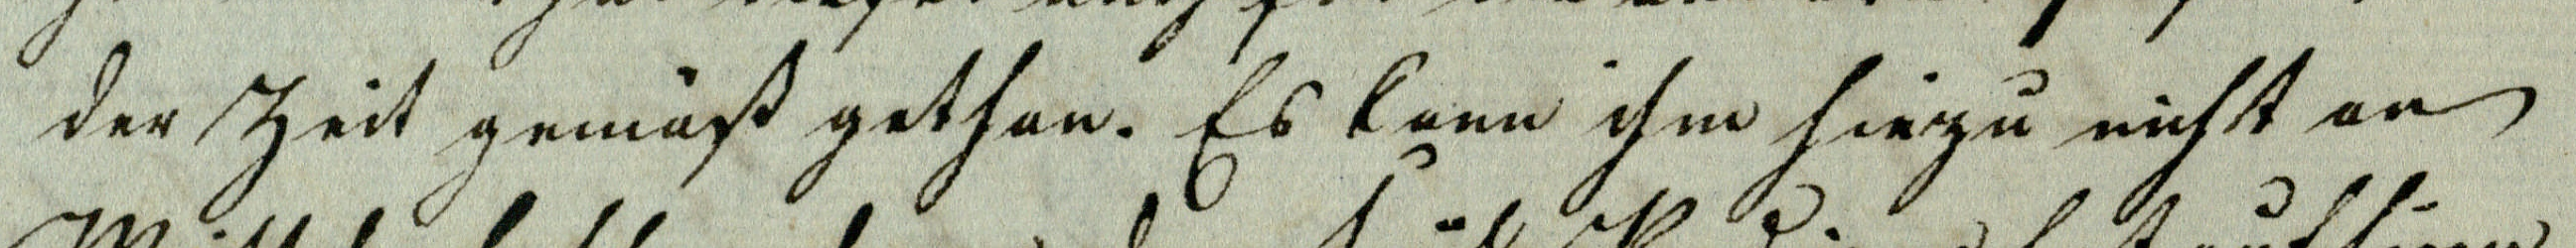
der Zeit gemäß gethan. Es kannn ihm hiezu nicht an
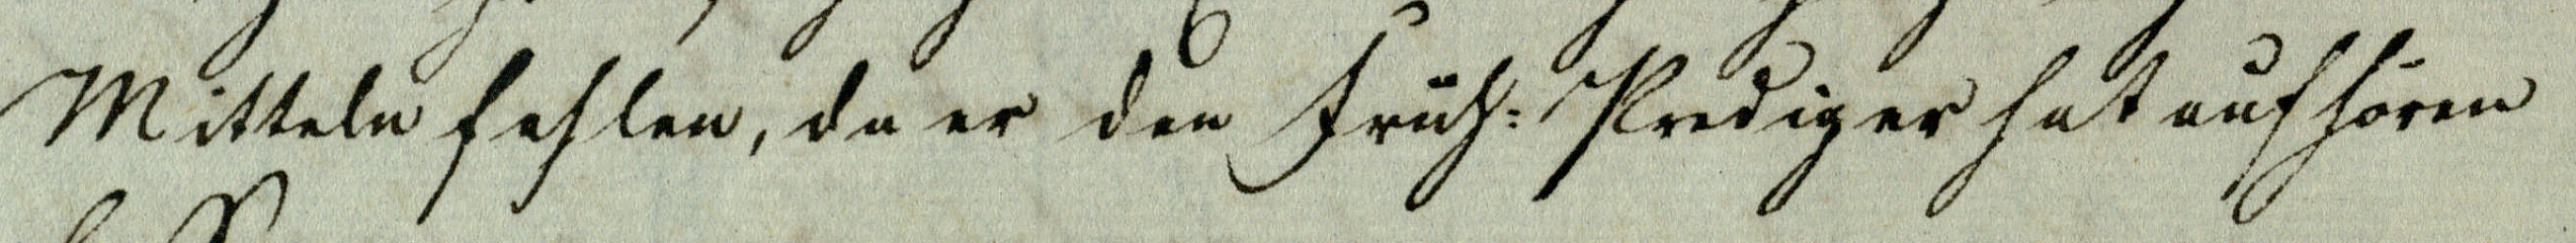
Mitteln fehlen, da er den Früh Prediger hat aufhören
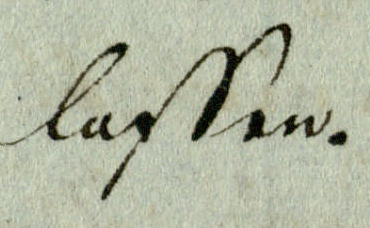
lassen.
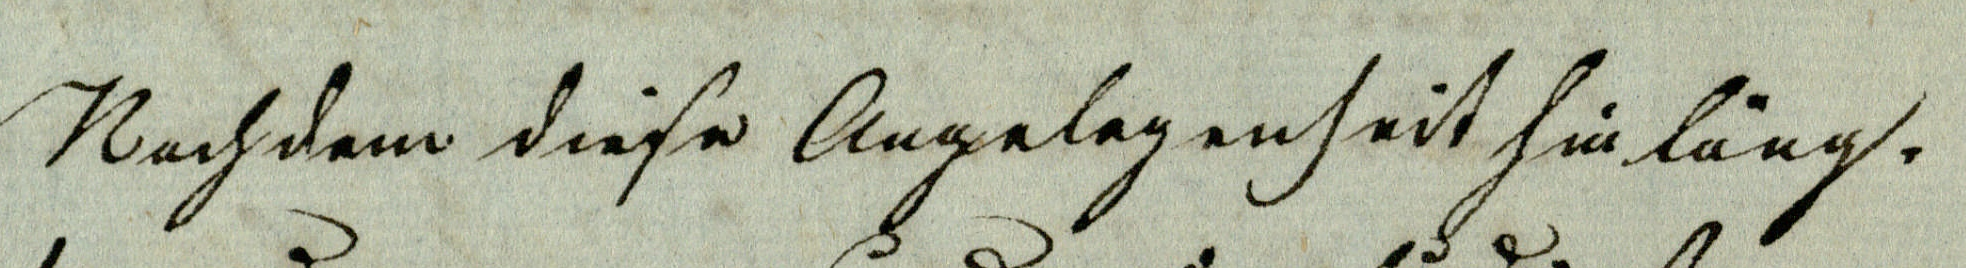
Nachdem diese Angelegenheit hinläng¬
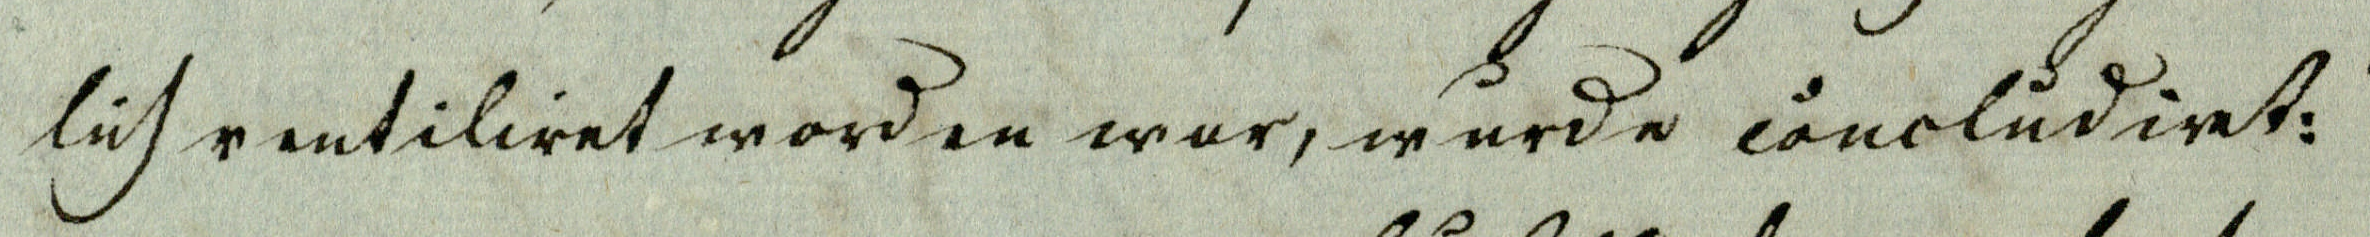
lich ventiliret worden war, wurde concludiret:
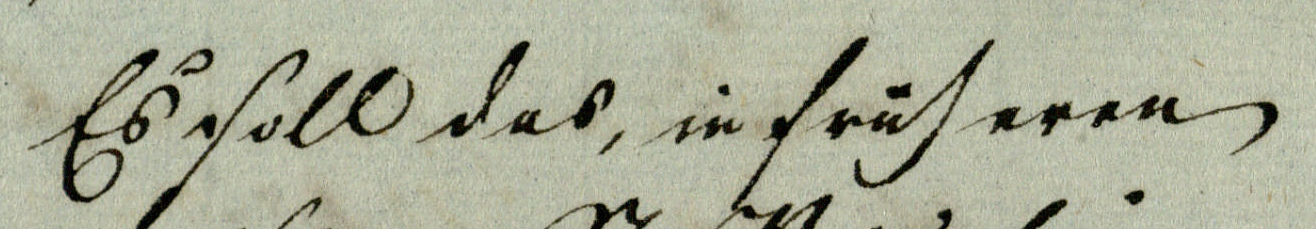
Es soll das, in früheren
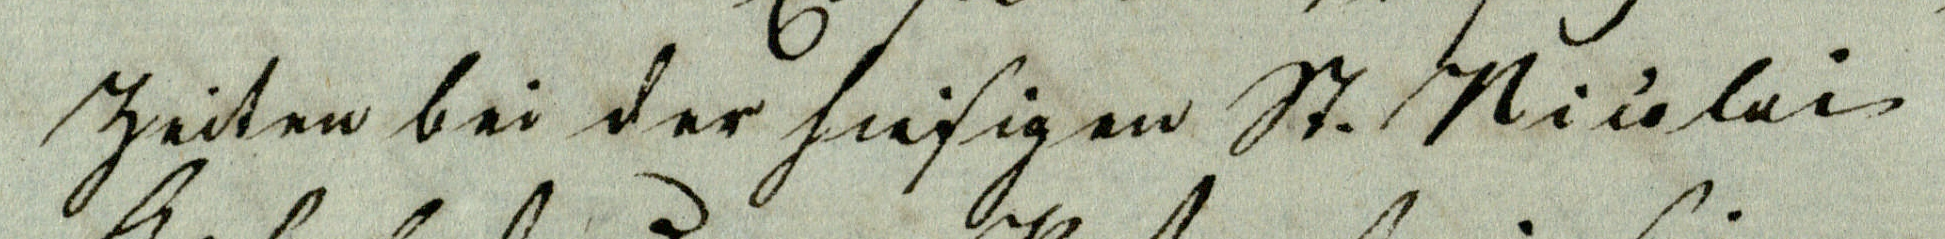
Zeiten bei der hiesigen St. Nicolai
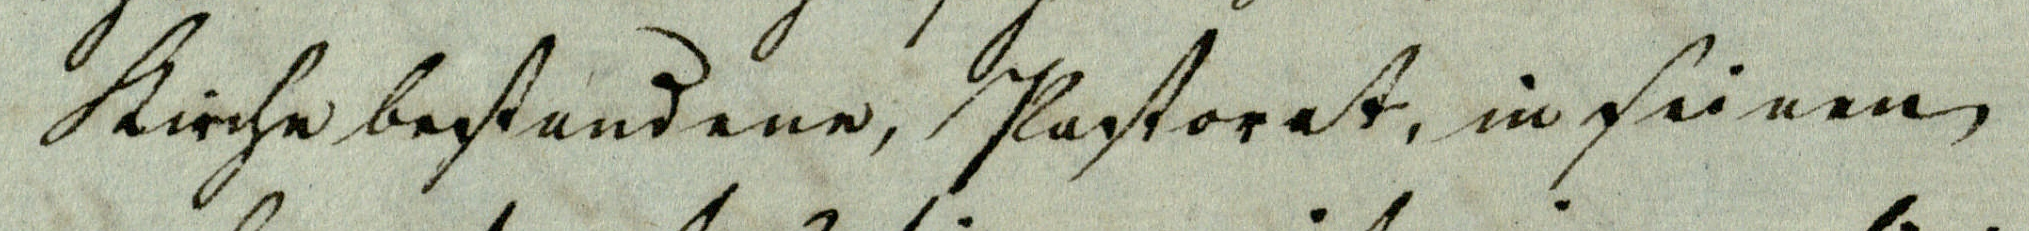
Kirche bestandene, Pastorat, in seinen
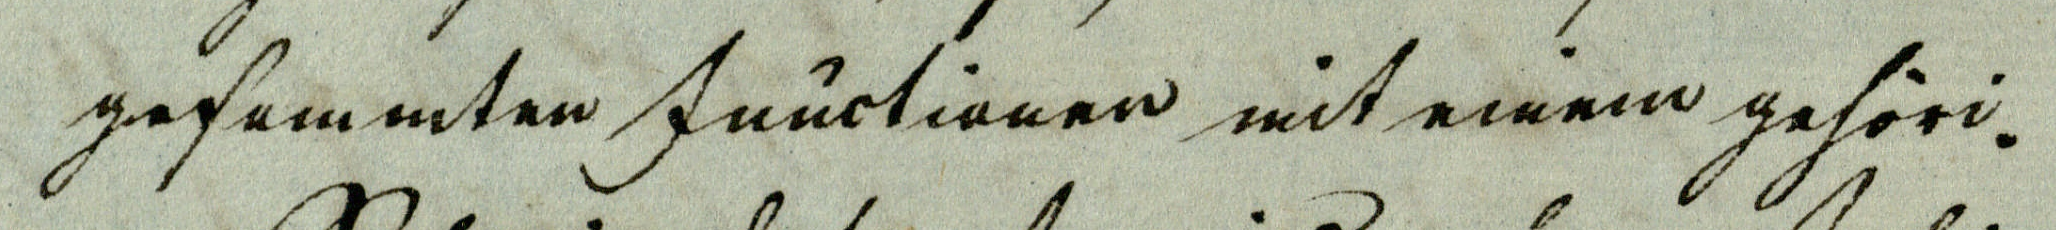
gesammten Functionen mit einem gehöri¬
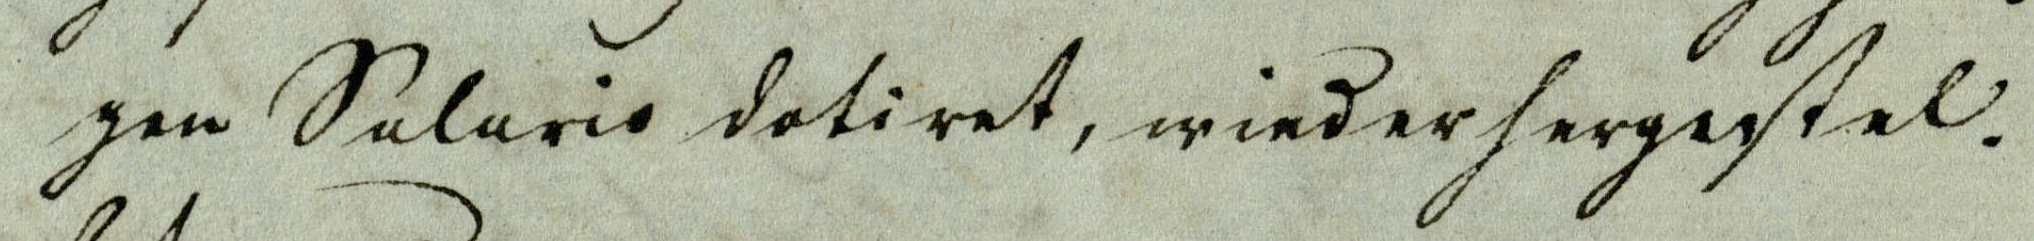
gen Salario dotiret, wiederhergestel¬
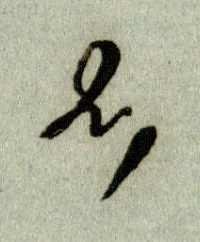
2,
